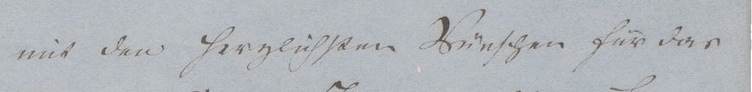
mit den herzlichsten Wünschen für das
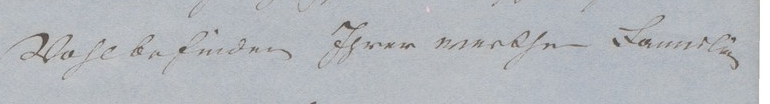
Wohlbefinden Ihrer werthn Famililie
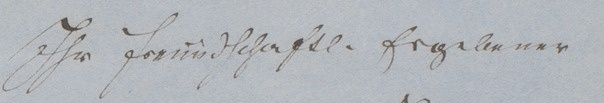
Ihr freundschaftl. Ergebener
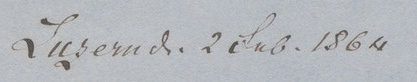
Luzern d. 02 Feb. 1864
